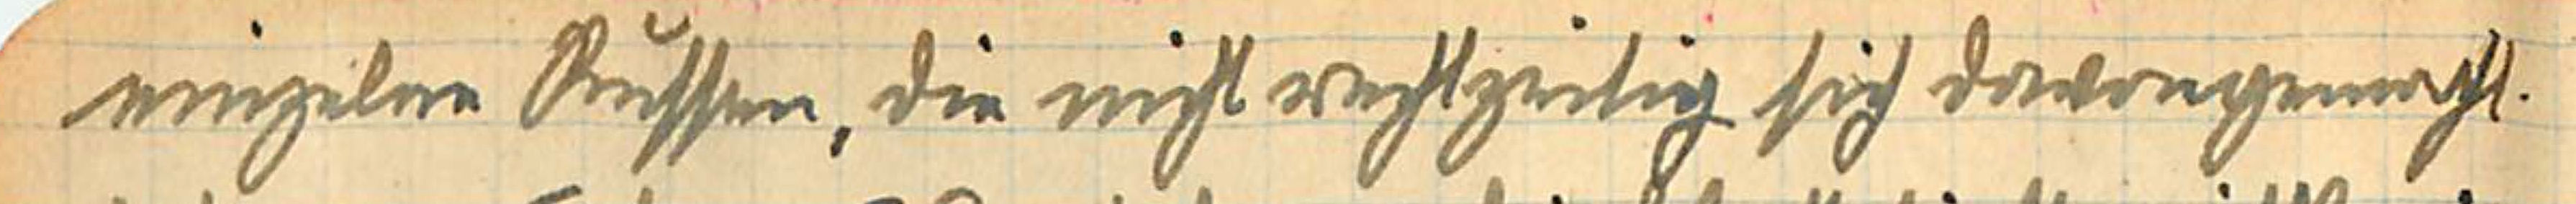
einzelne Russen, die nicht rechtzeitig sich davongemacht
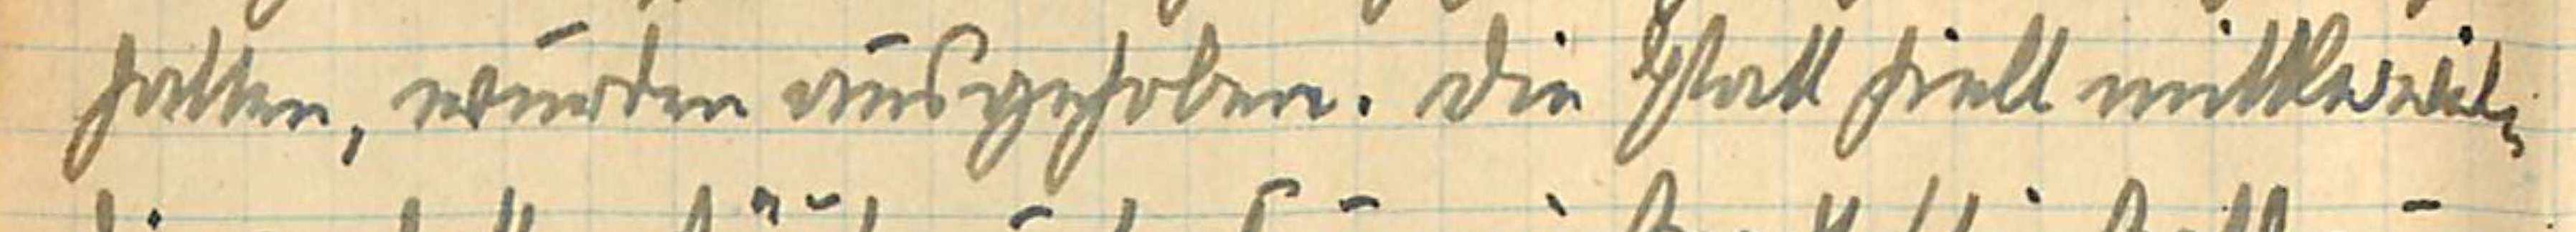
hatten, wurden ausgehoben. Die Pak hielt mittlerweile
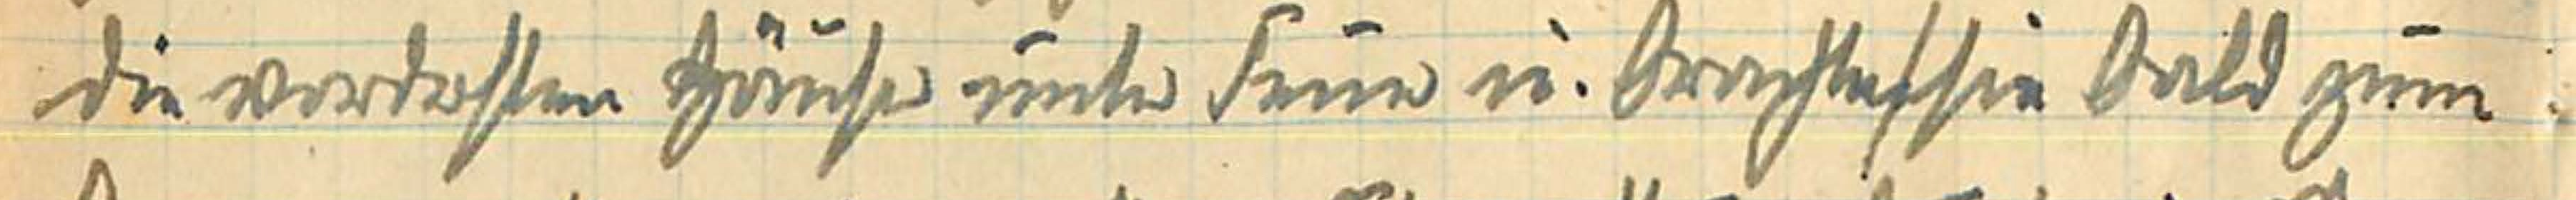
die vordersten Häuser unter Feuer u. brachte sie bald zum
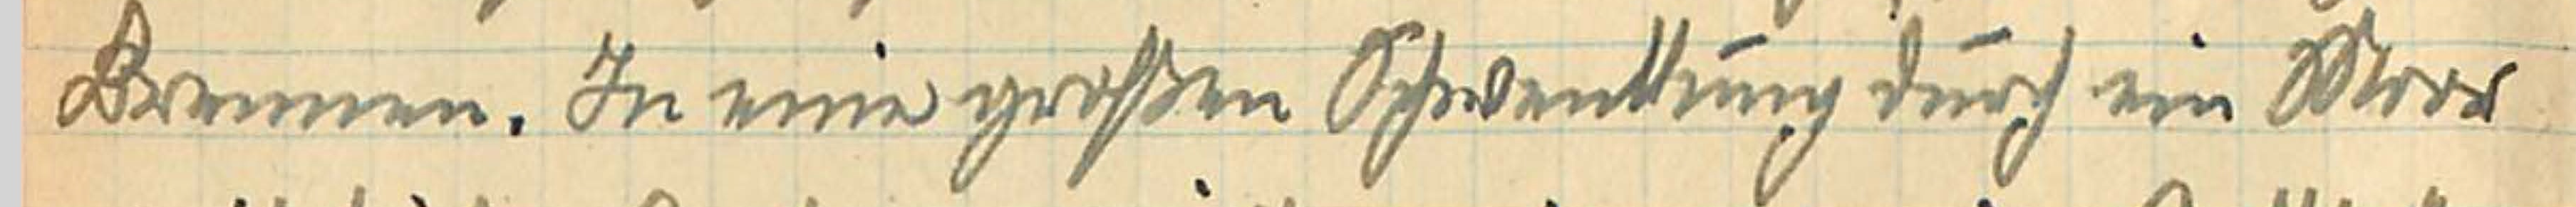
Brennen. In einer großen Schwenkung durch ein Moor
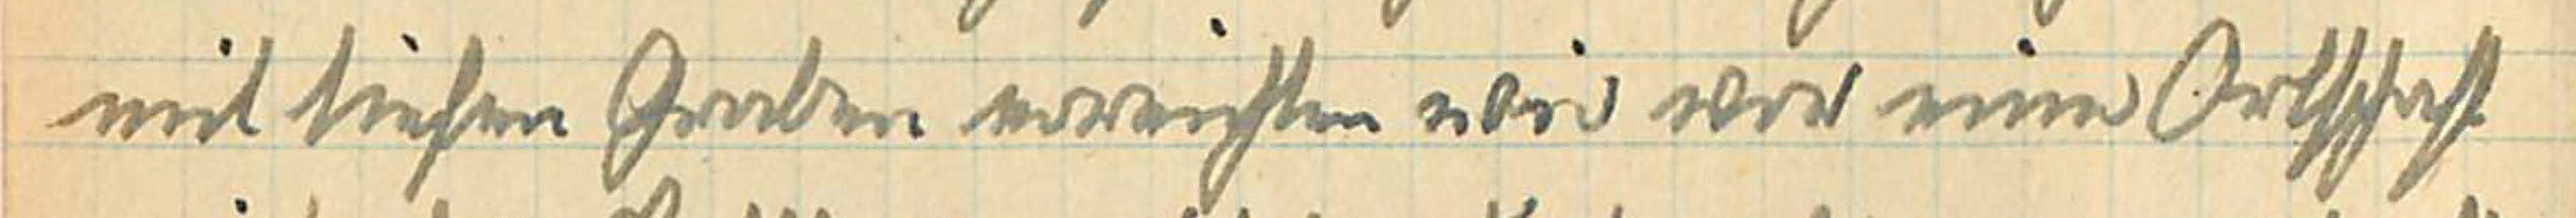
mit tiefen Graben erreichten wir vor einer Ortschaft
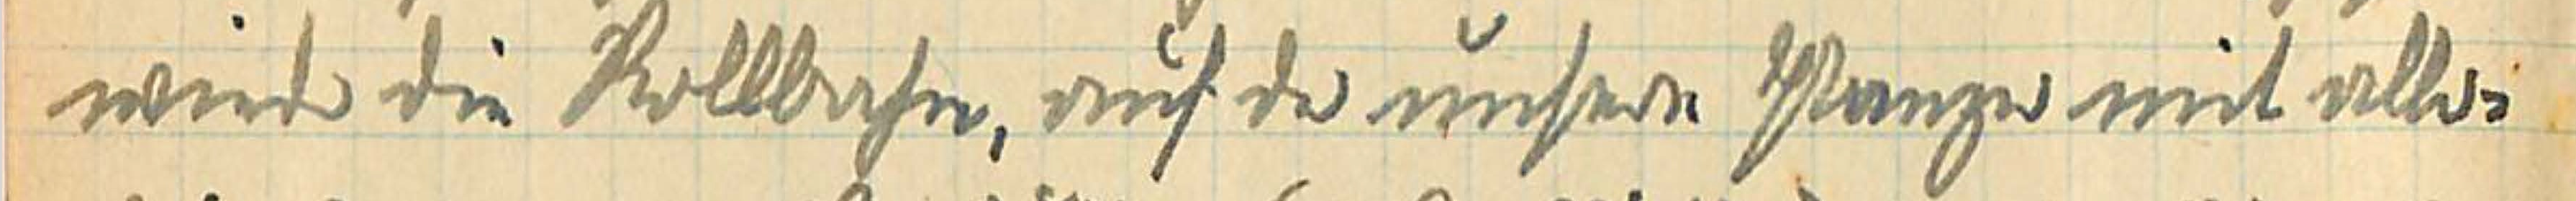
wieder die Rollbahn, auf der unsere Panzer mit aller-
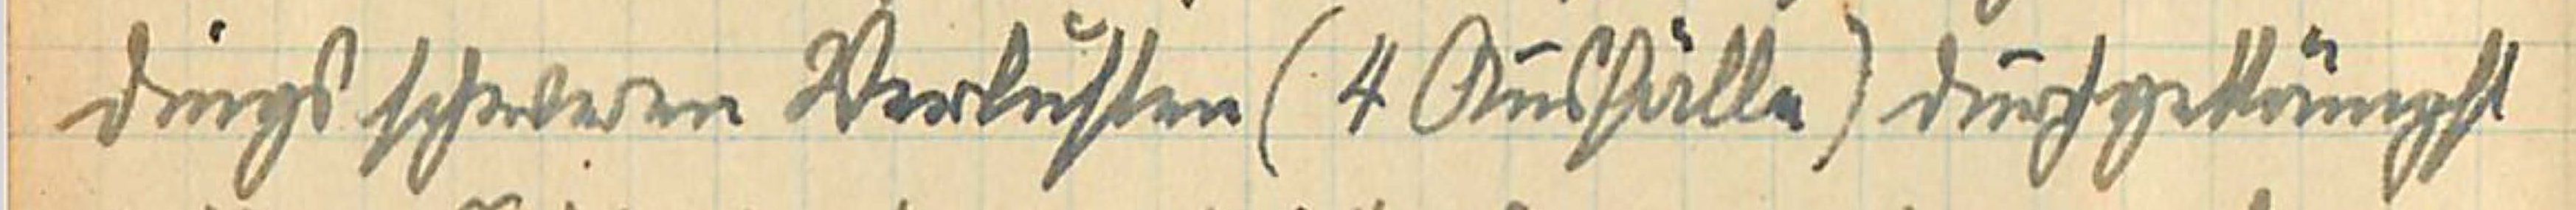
dings schweren Verlusten (4 Ausfälle) durchgekämpft
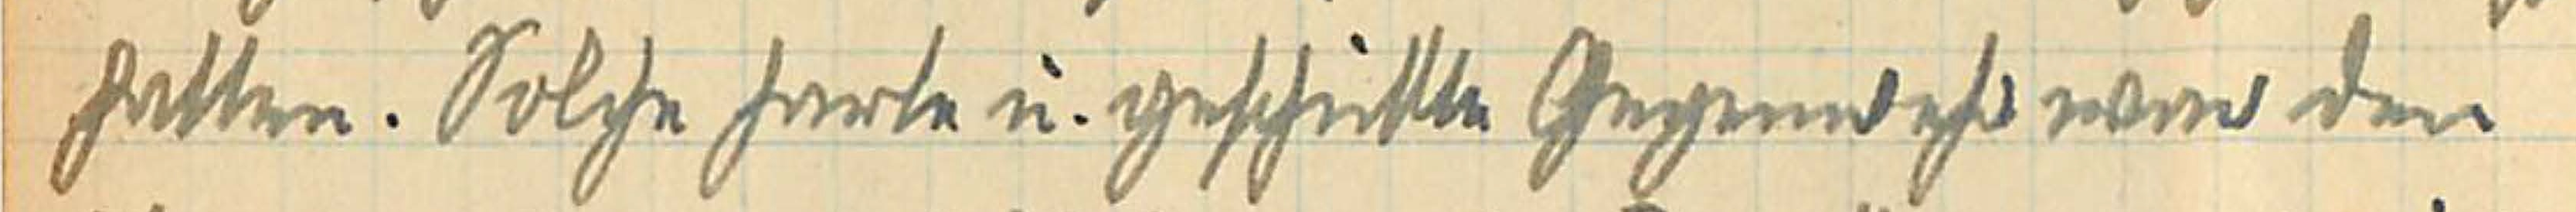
hatten. Solche harte u. geschickte Gegenwehr war den
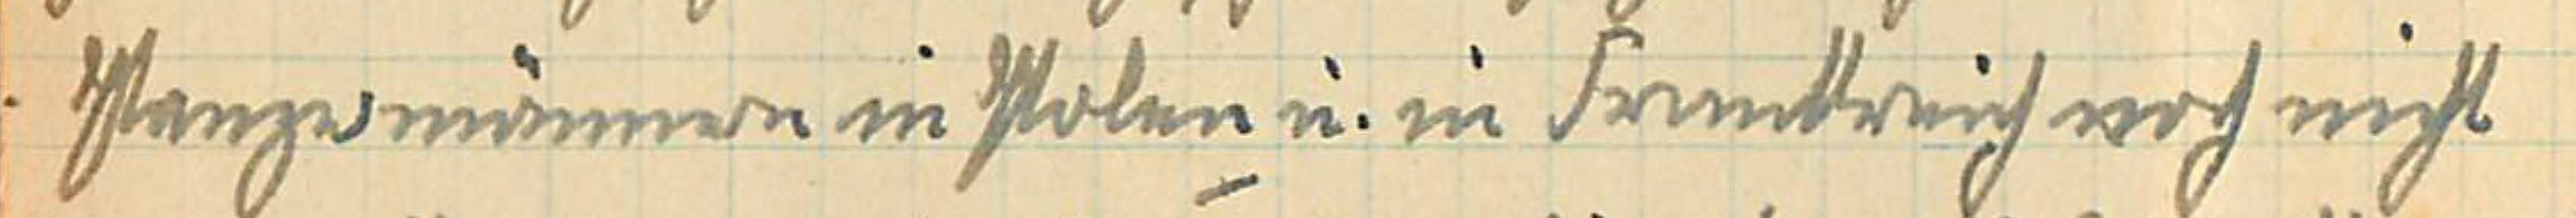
Panzermännern in Polen u. in Frankreich noch nicht
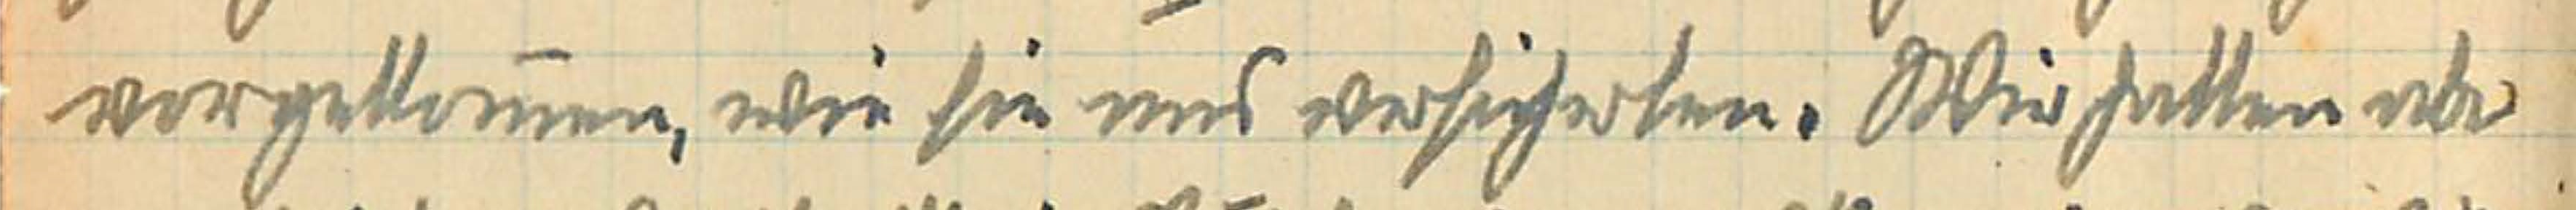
vorgekommen, wie sie uns versicherten. Wir hatten aber
